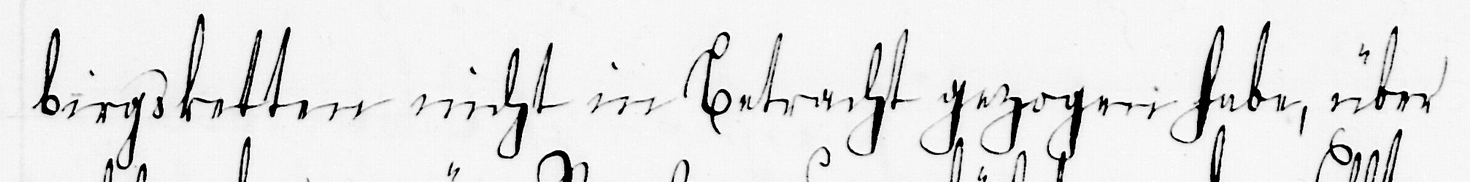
birgsketten nicht in Betracht gezogen habe, über
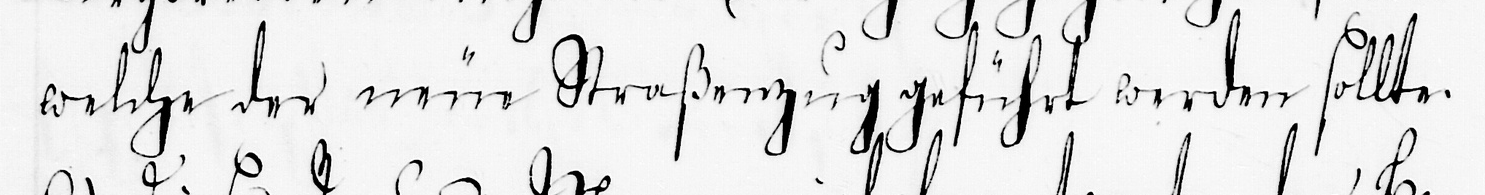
welche der neue Straßenzug geführt werden sollte.
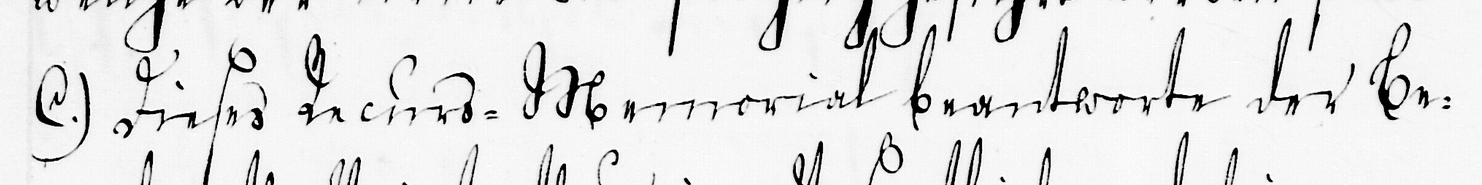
C.) Dieses Recurs-Memorial beantworte der Be¬
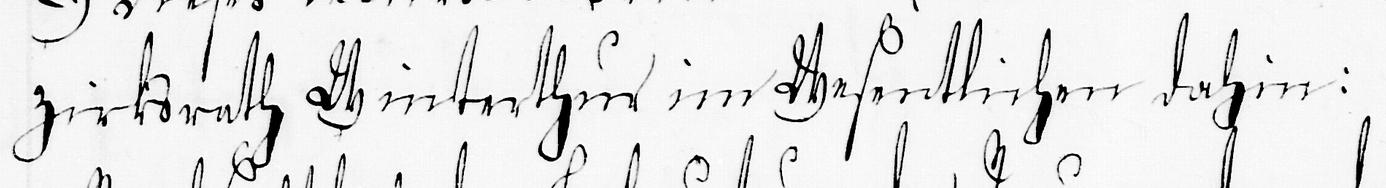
zirksrath Winterthur im Wesentlichen dahin:
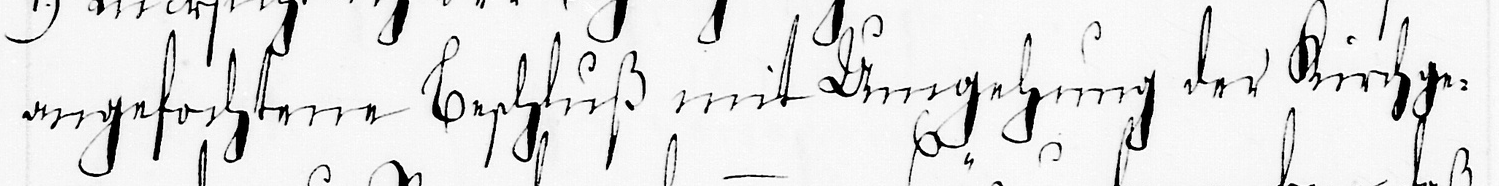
angefochtene Beschluß mit Umgehung der Kirchge¬
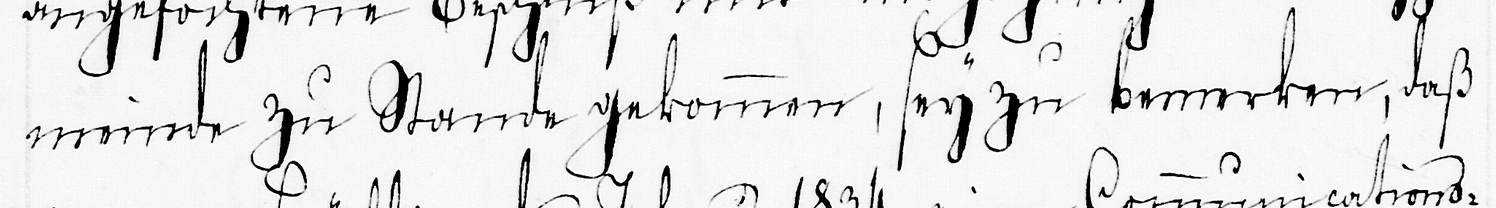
meinde zu Stande gekommen, sey zu bemerken, daß
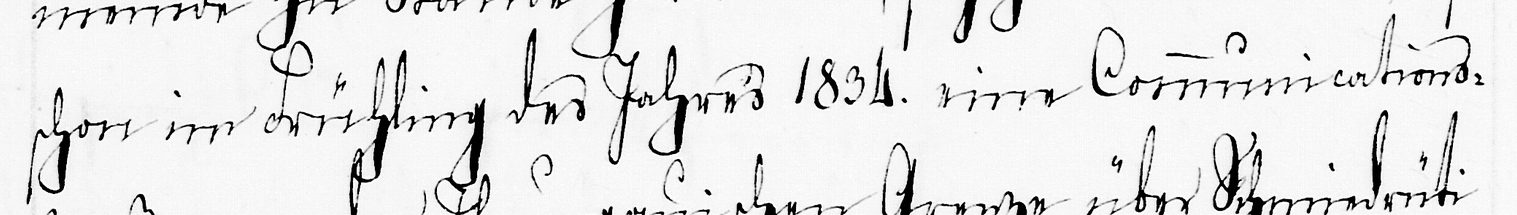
schon im Frühling des Jahres 1834. eine Communications¬
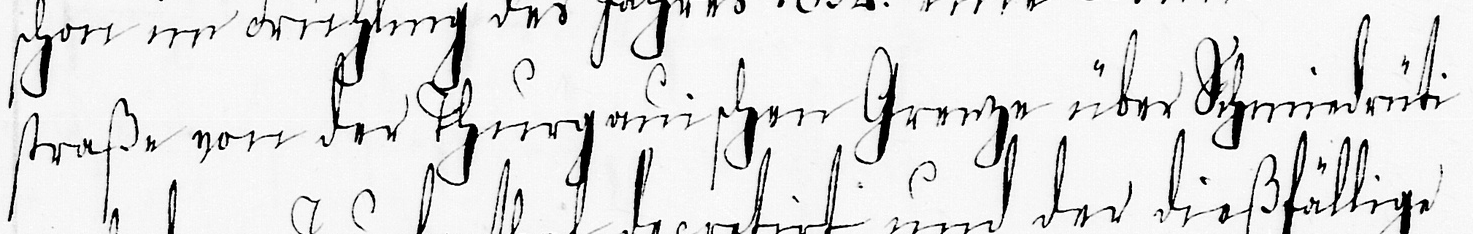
straße von der Thurgauischen Grenze über Schmiedrüti
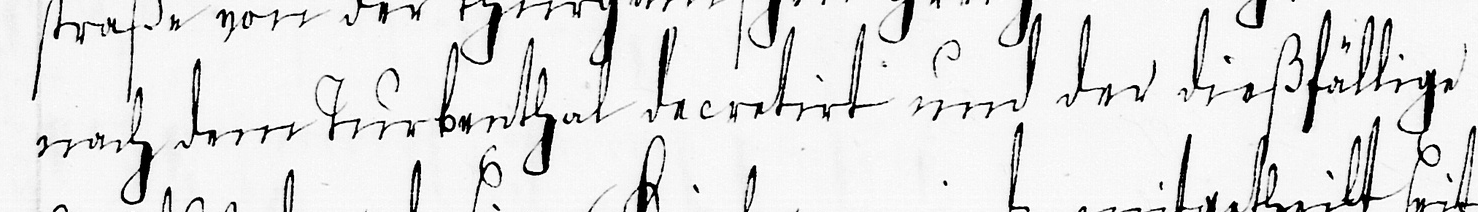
nach dem Turbenthal decretirt und der dießfällige
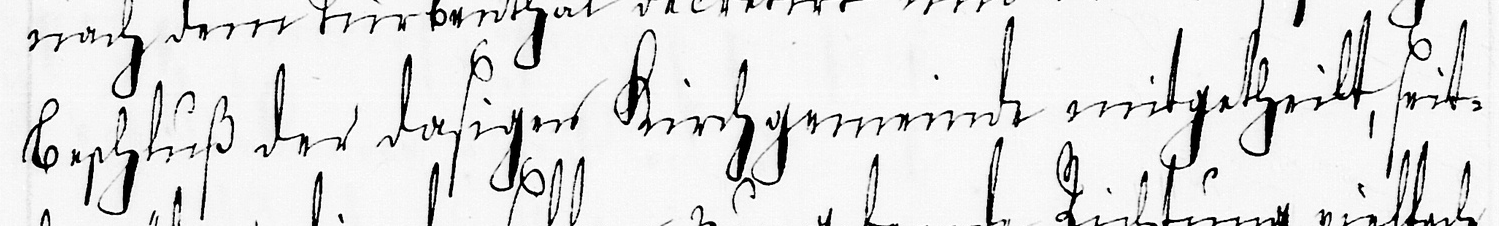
Beschluß der dasigen Kirchgemeinde mitgetheilt, sei¬
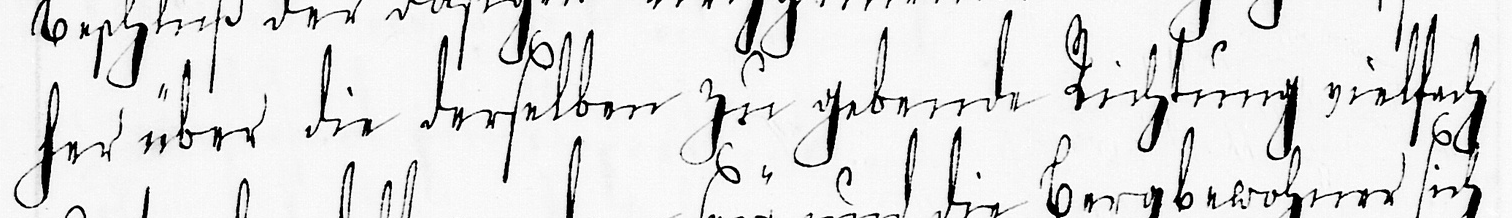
ther über die derselben zu gebende Richtung vielfach
